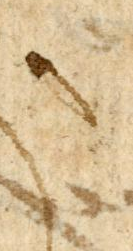To
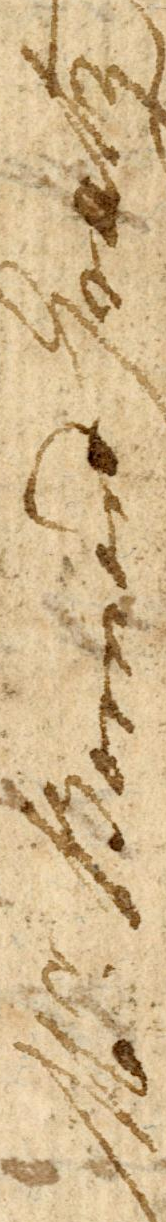M^r Barnard Gratz
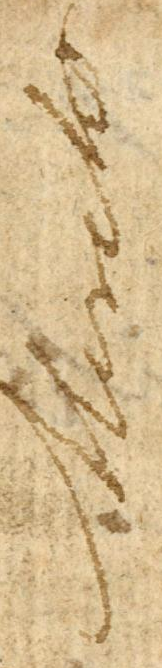Merch^t
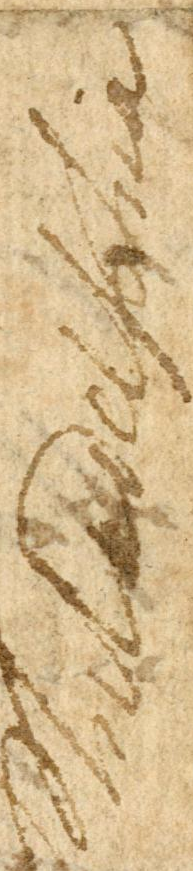Philadelphia
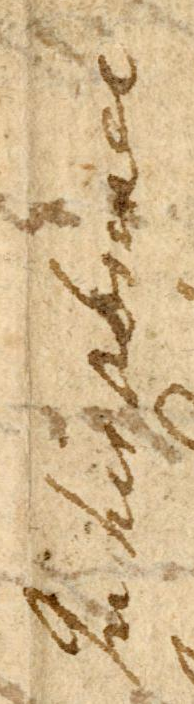In His absence
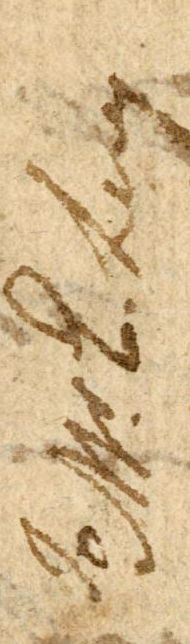to M^r E. Levy
